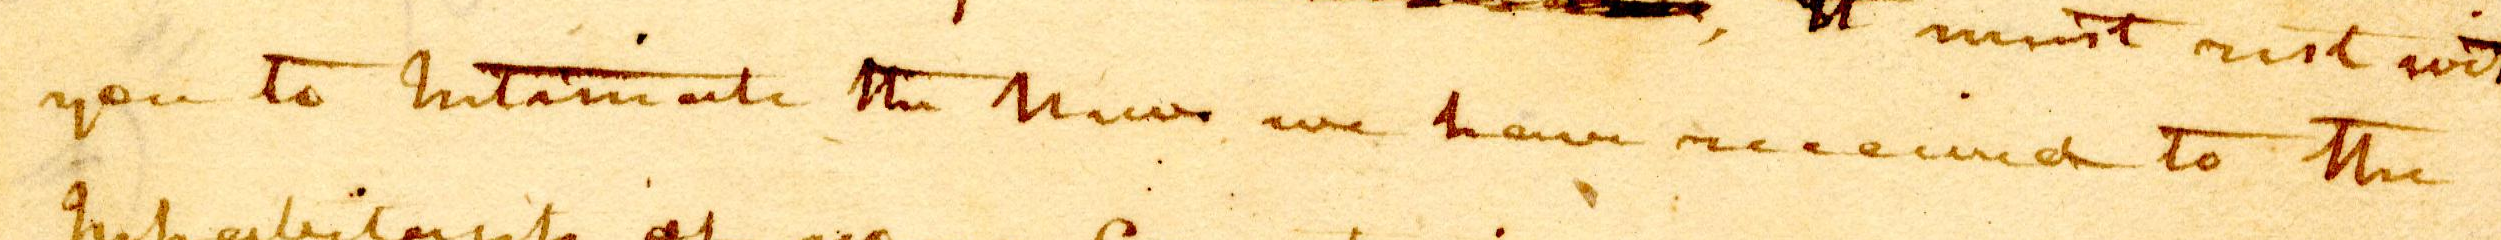you to intimate the News we have received to the
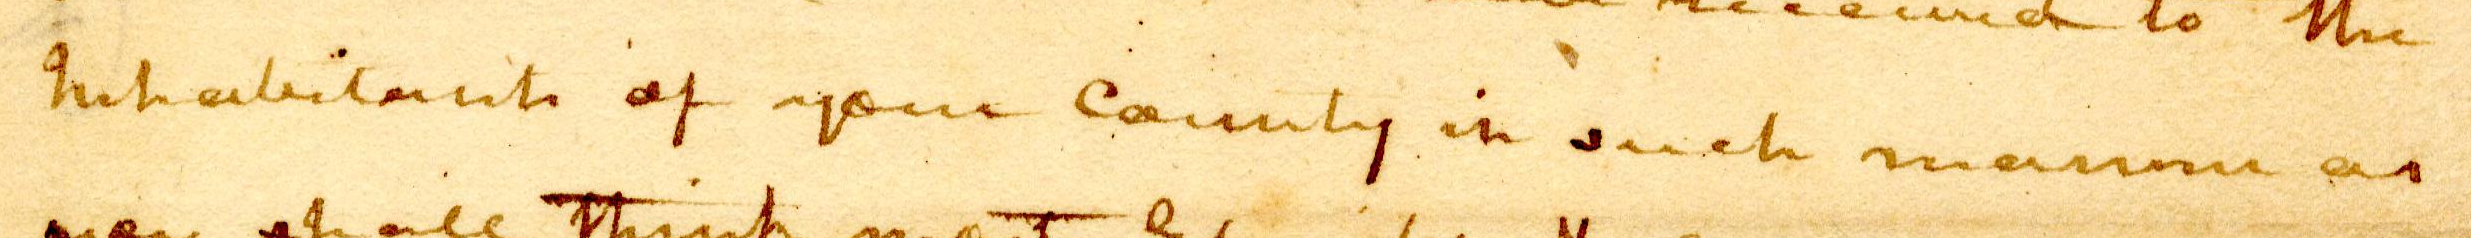Inhabitants of your Country in such manner as
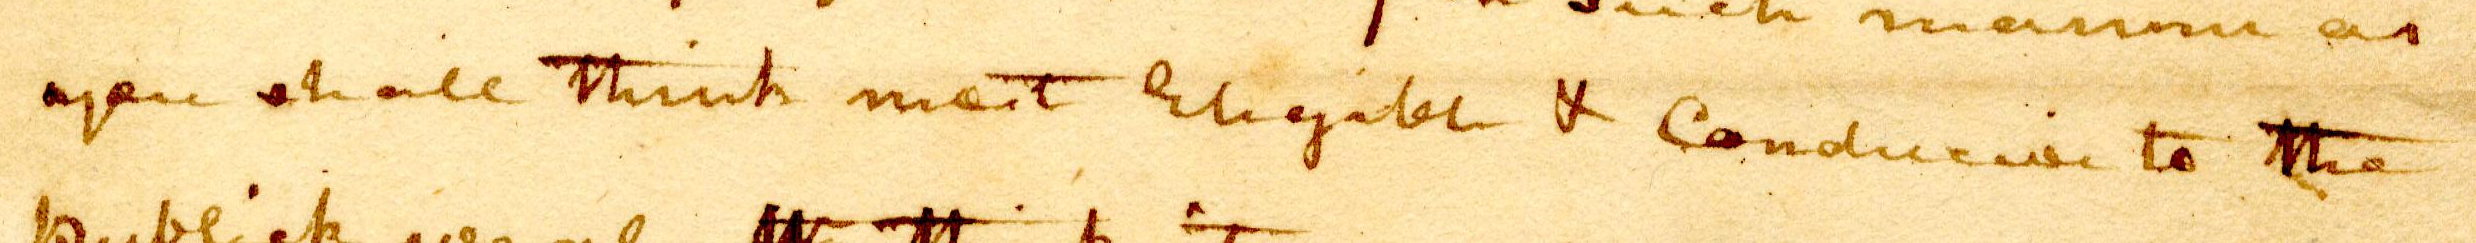you shall think most Eligible & Conducive to the
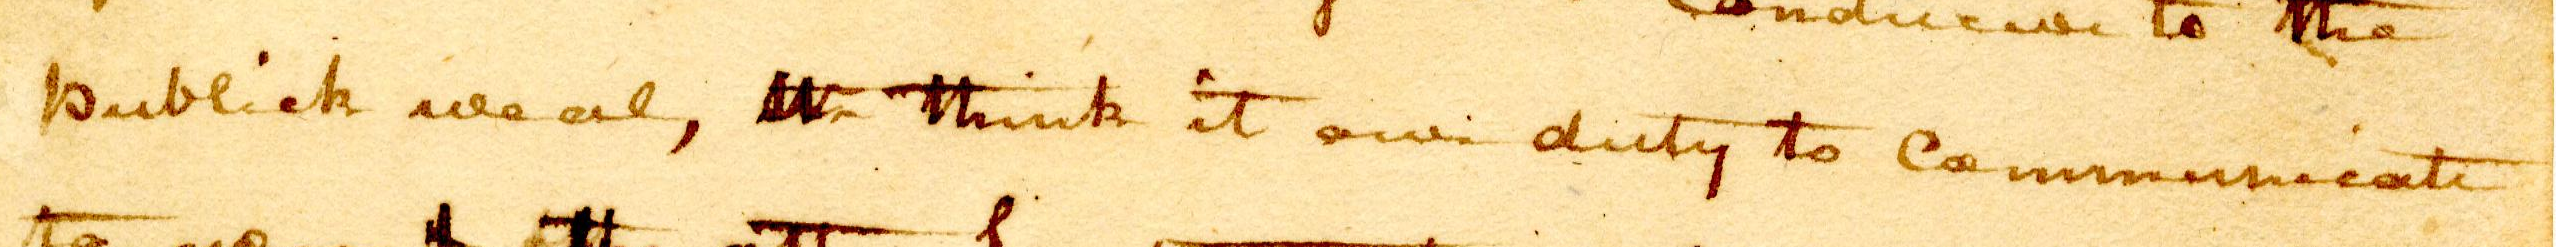Publick weal, We think it our duty to Communicate
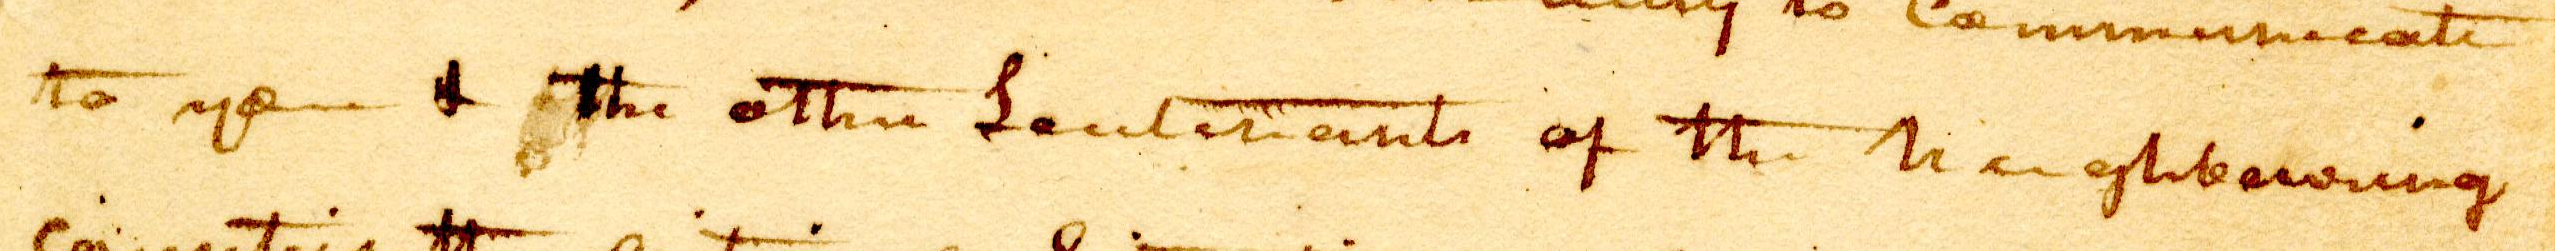to you & the other Lieutenants of the Neighbouring
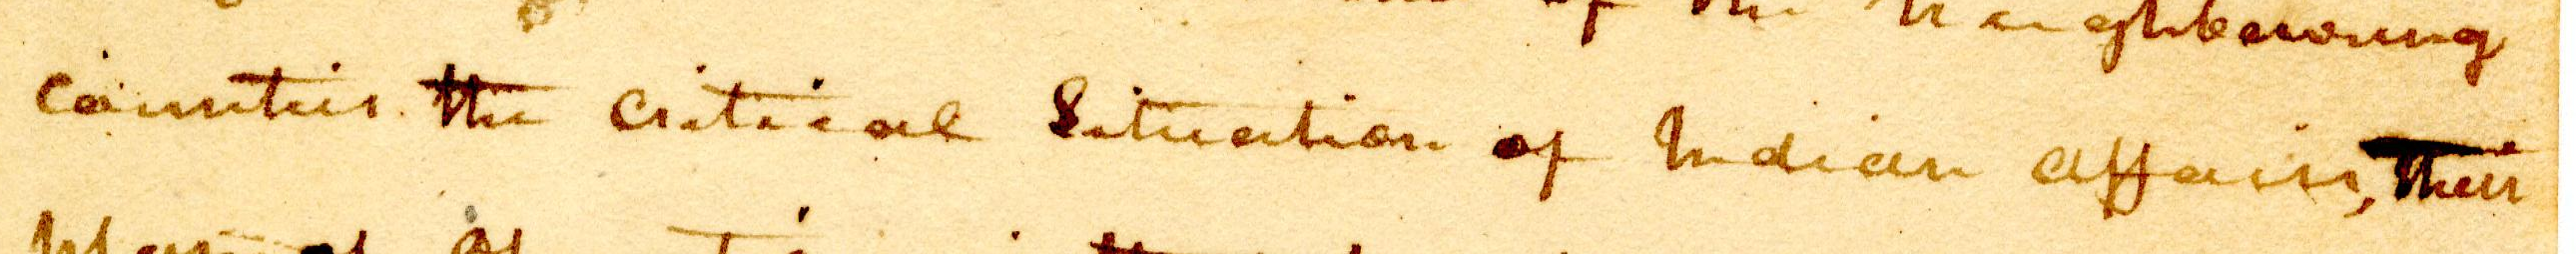counties the critical Situation of Indian Affairs. Their
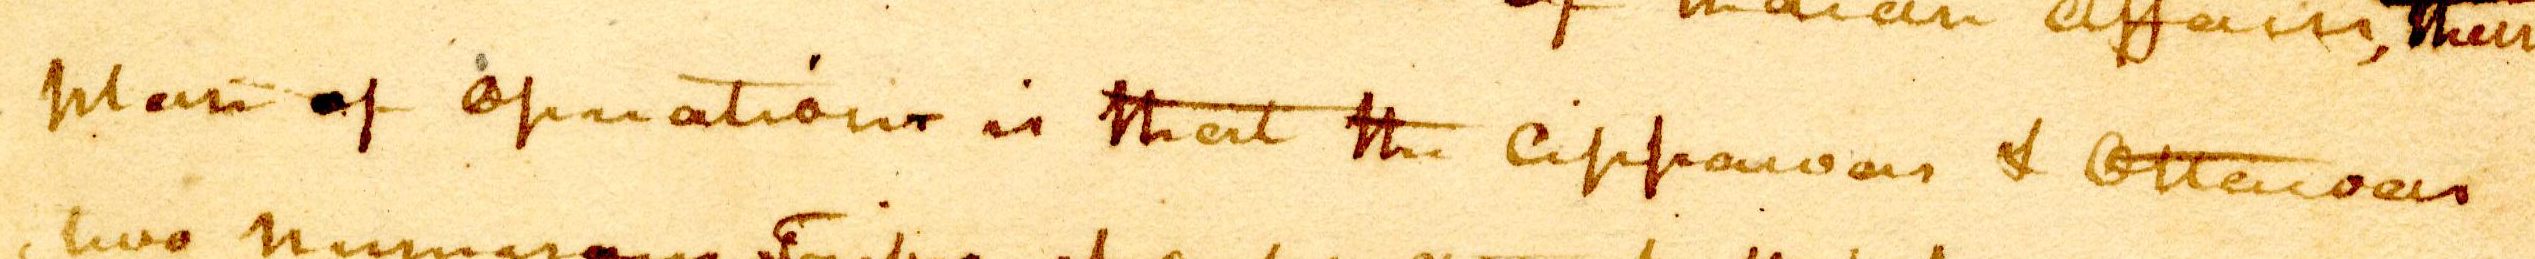plan of operations is that the Chippawaws & Ottawaws
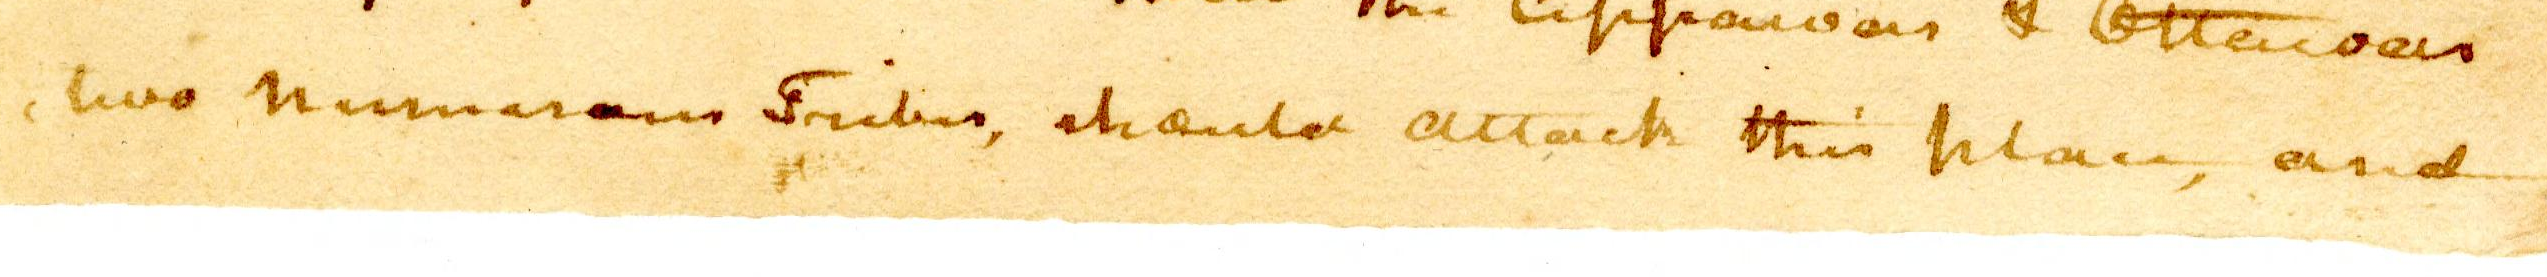two Numerous Tribes, should attack this place, and
